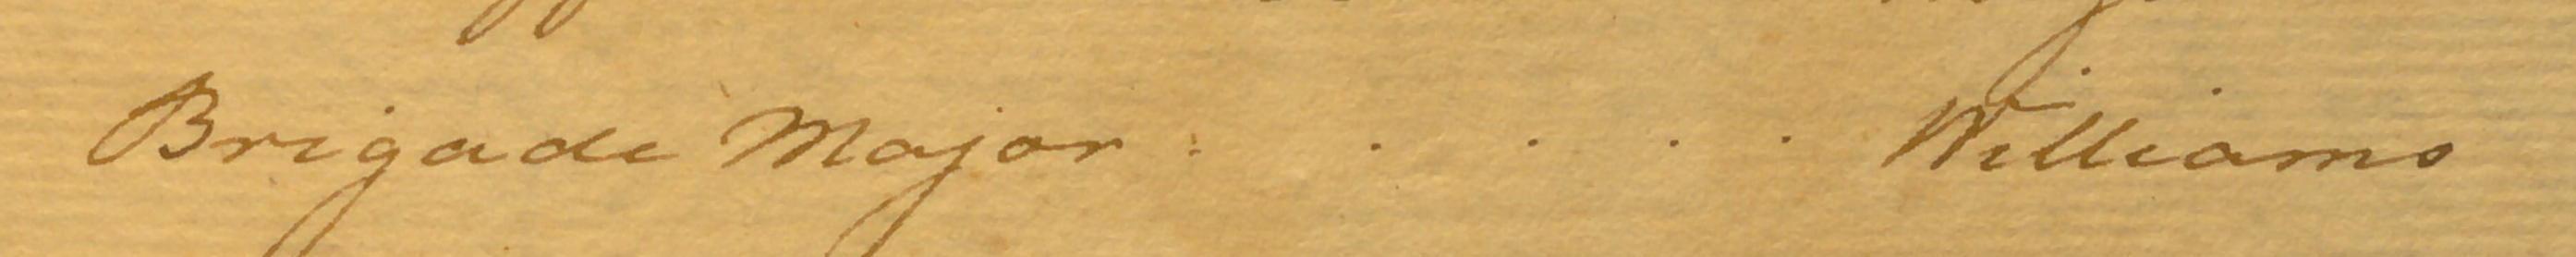Brigade Major. .... Williams
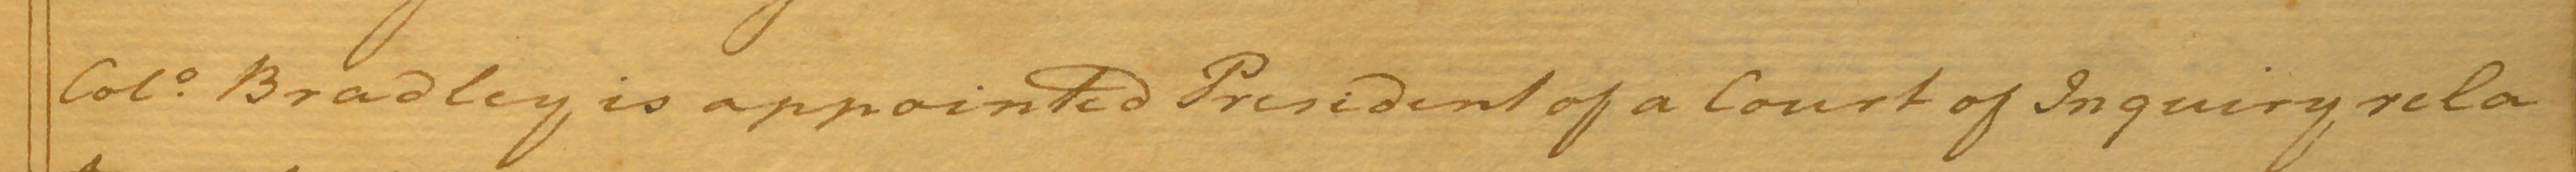Col^o. Bradley is appointed President of a Court of Inquiry rela
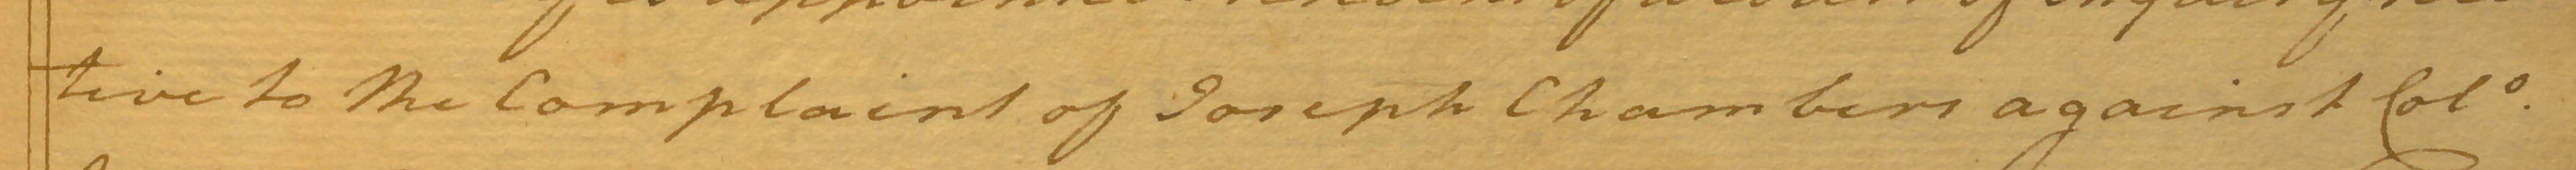tive to the Complaint of Joseph Chambers against Col^o.
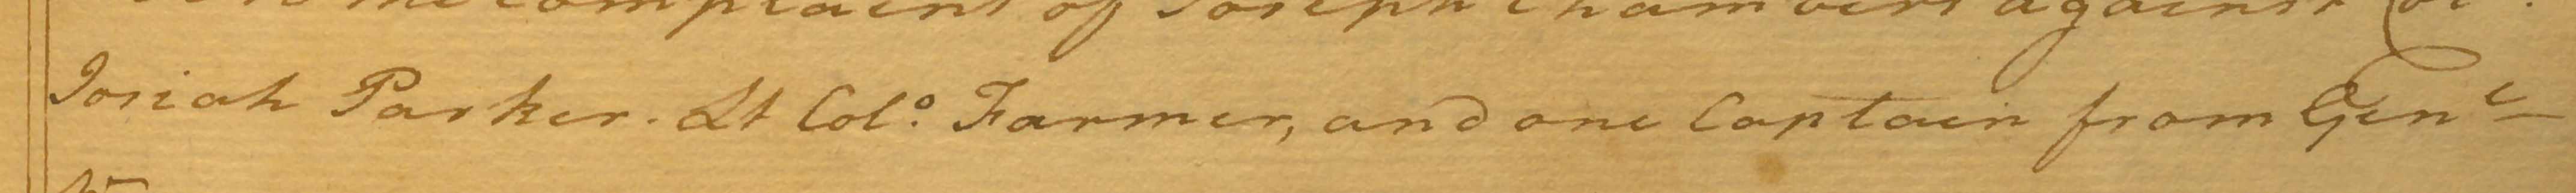Josiah Parker. Lt Col^o. Farmer, and one Captain from Gen^l.
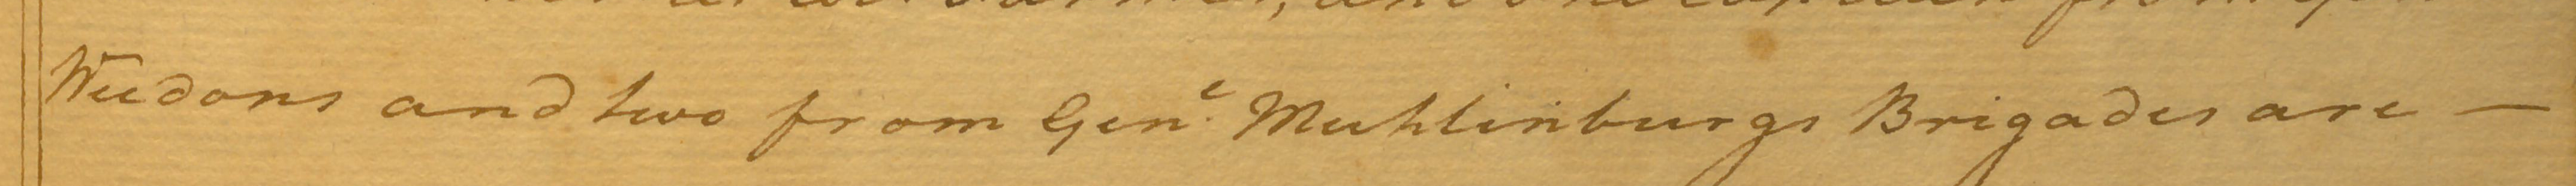Weedons and two from Gen^l. Muhlenburgs Brigades are-
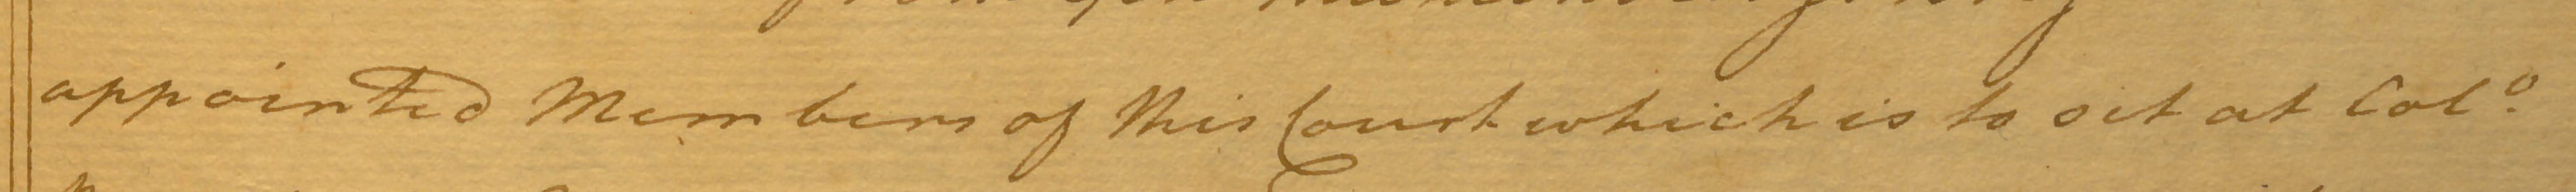appointed Members of this Court which is to set at Col^o.
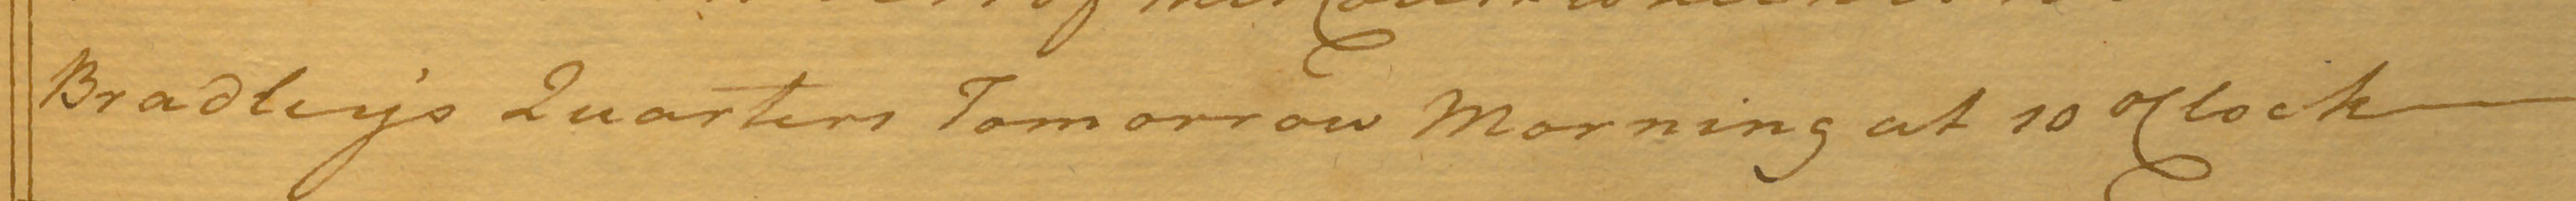Bradley's Quarters Tomorrow morning at 10 ^oClock
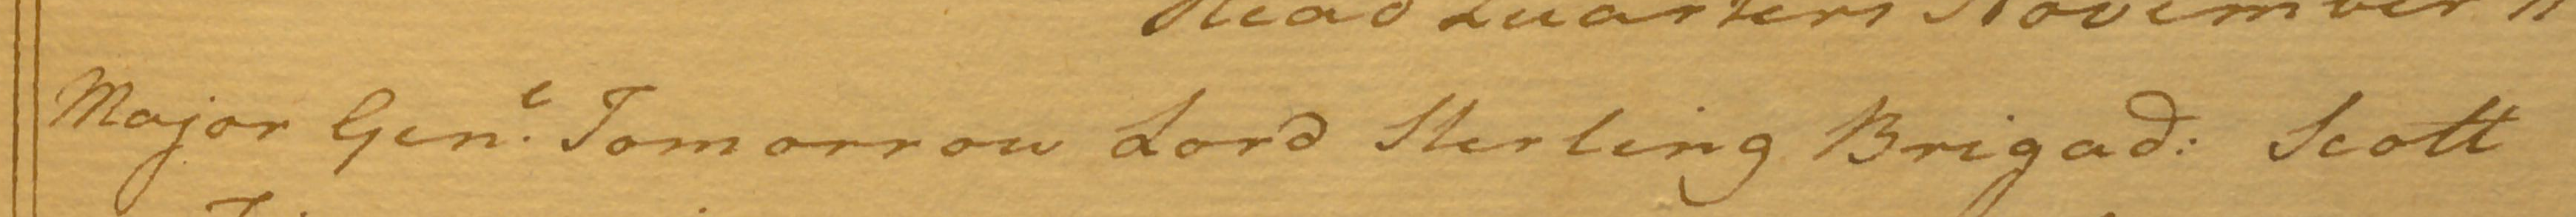Major Gen^l. Tomorrow Lord Sterling Brigad: Scott
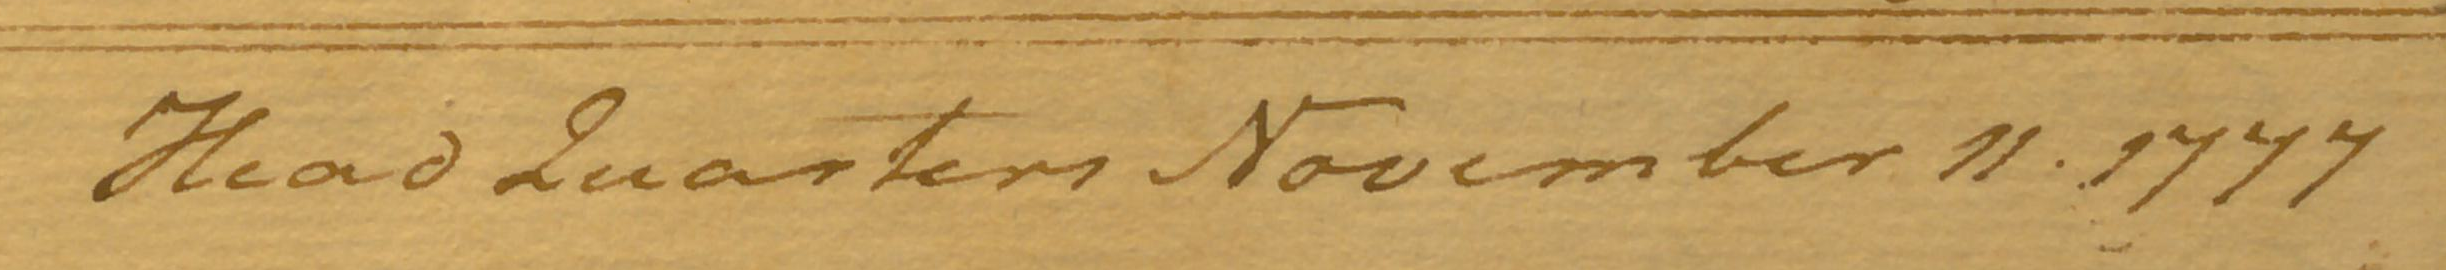Head Quarters November 11. 1777
